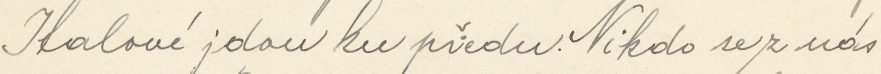Italové jdou ku předu. Nikdo se z nás
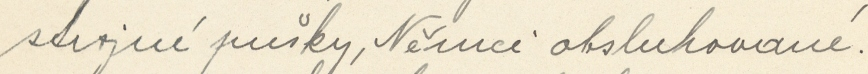strojní pušky, Němci obsluhované.
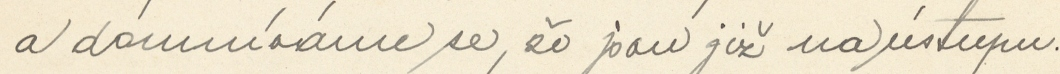a domníváme se, že jsou již na ústupu.
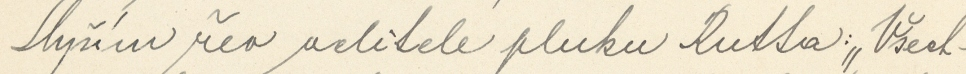Slyším řev velitele pluku Rutta: „Všech-
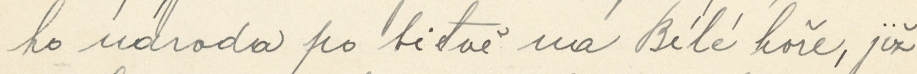ho národa po bitvě na Bílé hoře, již
